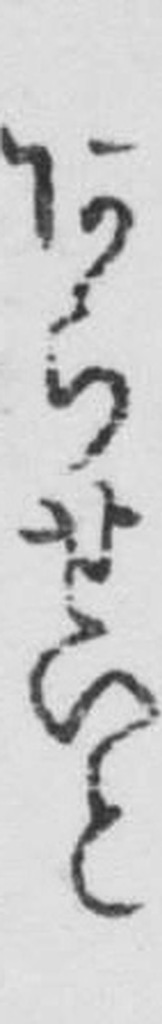あらせいと
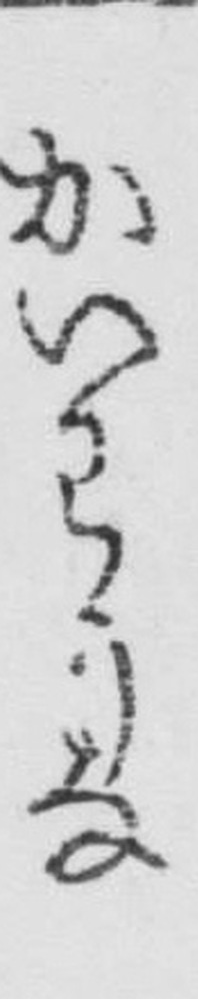かいわりな
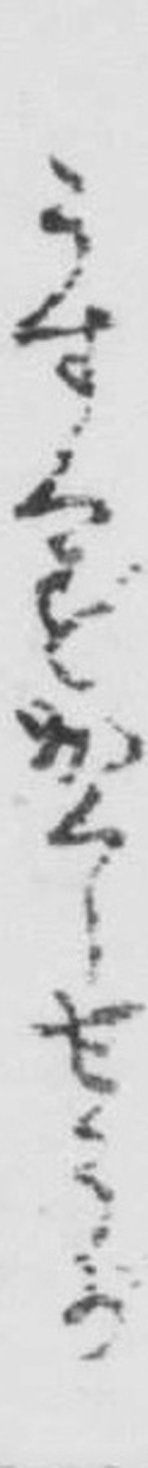うすくずかくしせうが
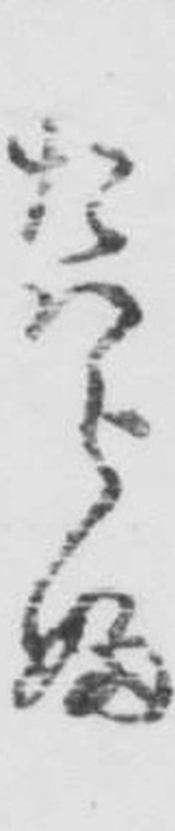たはらふ
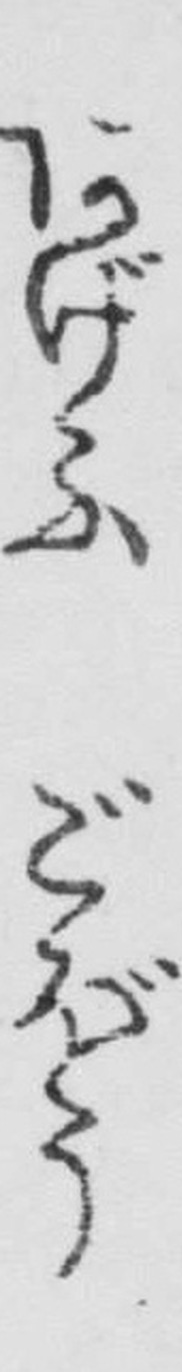あげふごぼう
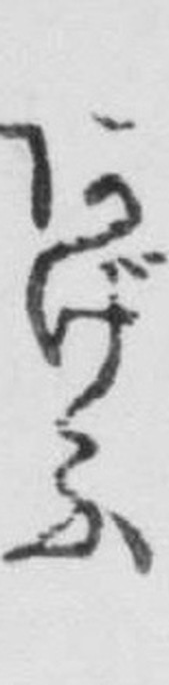あけふ
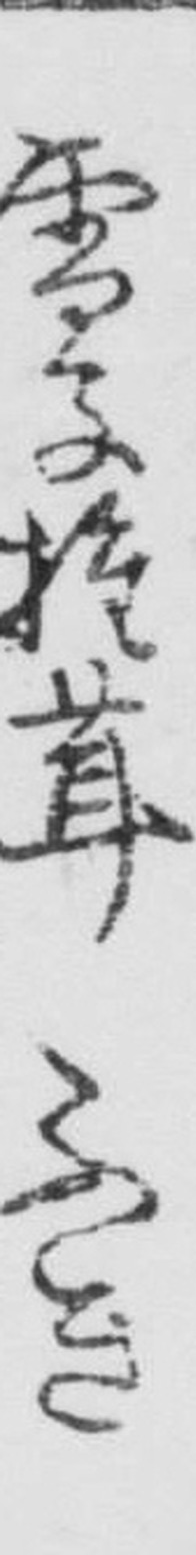雪子椎茸ふき
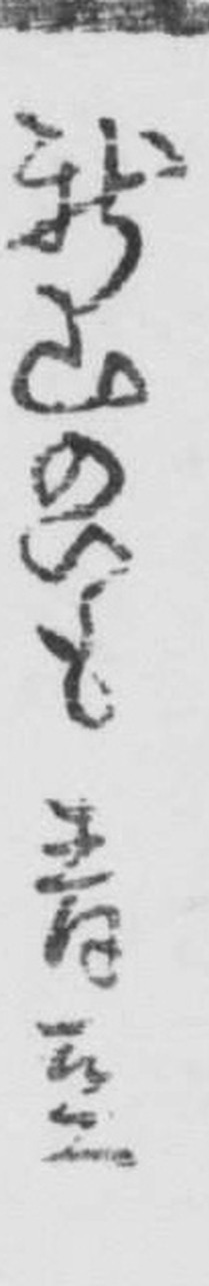新山のいも青豆
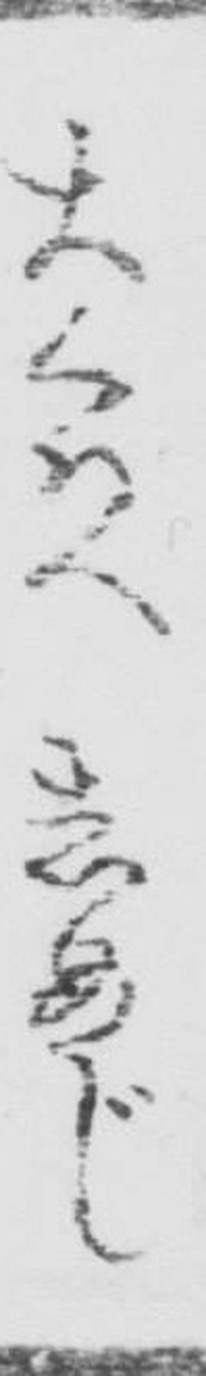大くはへしめじ
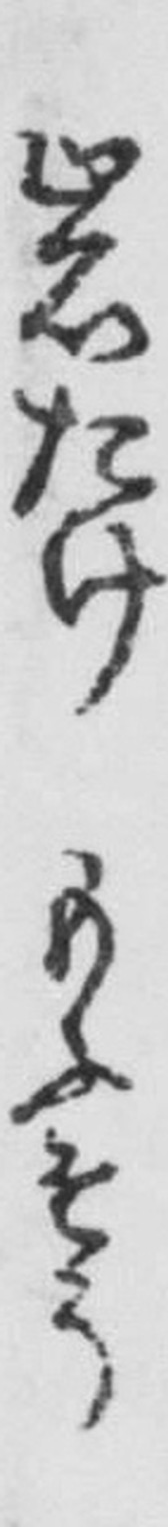岩たけもふそう
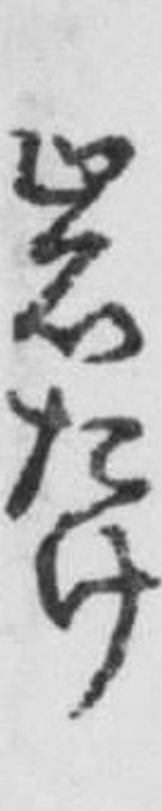椎たけ
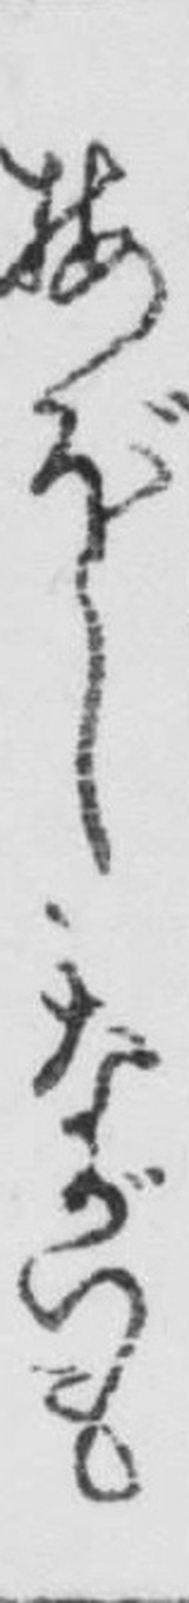梅ぼしながいも
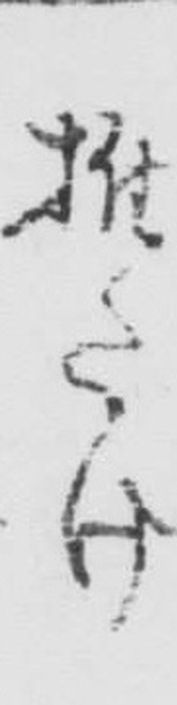椎たけ
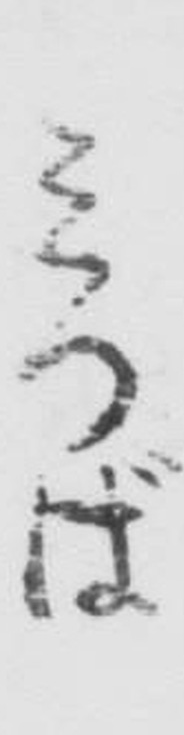みつば
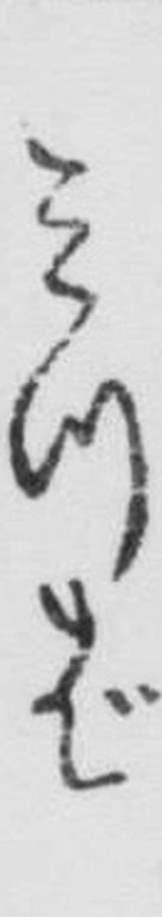みつば
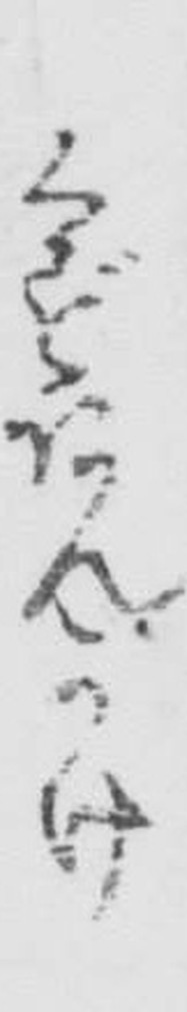くずあんかけ
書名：諸家通用/即席料理
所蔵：大阪府立大学学術情報センター 国文学研究資料館
